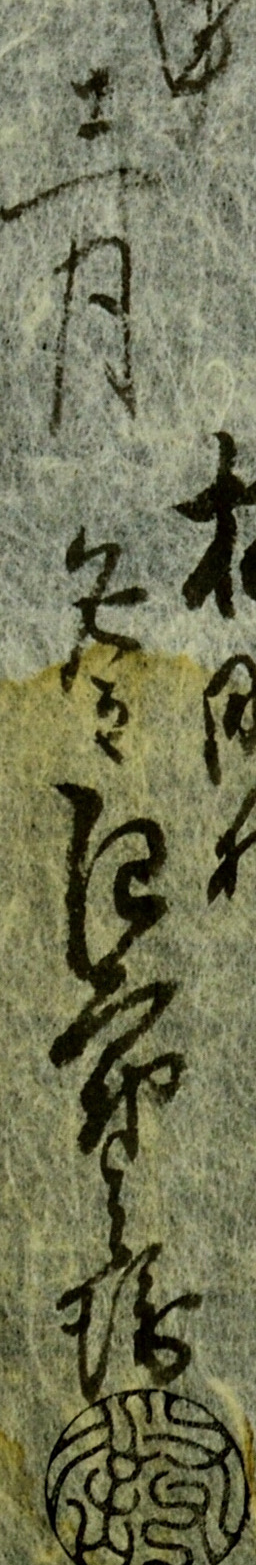十二月名主四郎兵衛㊞

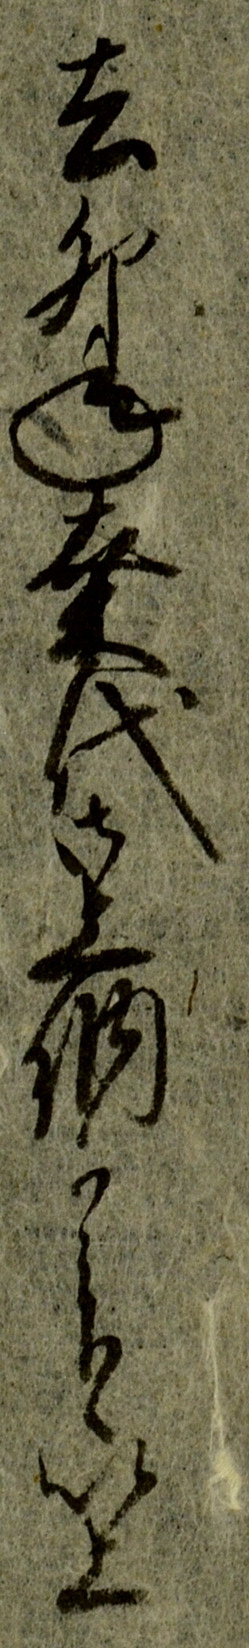去卯年桑代御上納可被下候以上
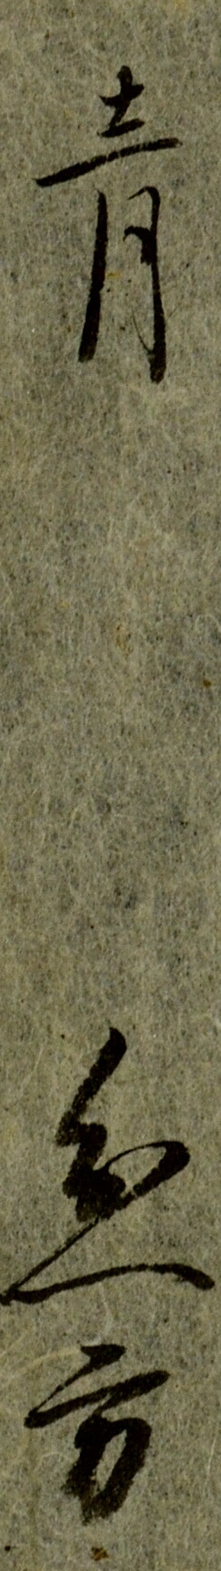十二月分一方
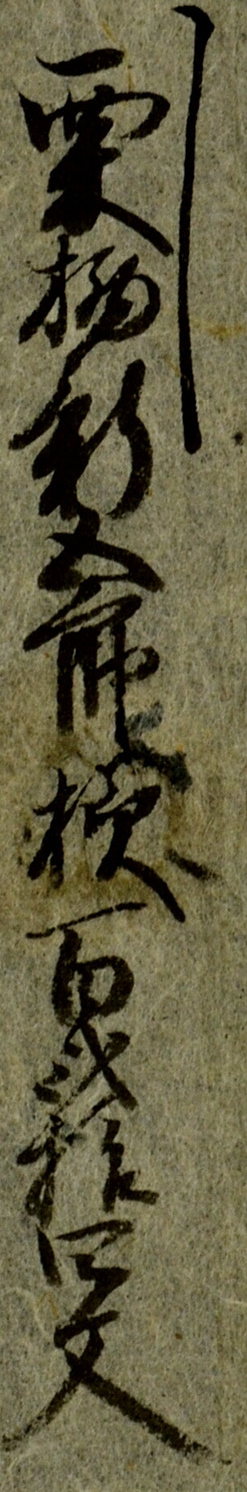栗栖新五郎様百弐拾四文
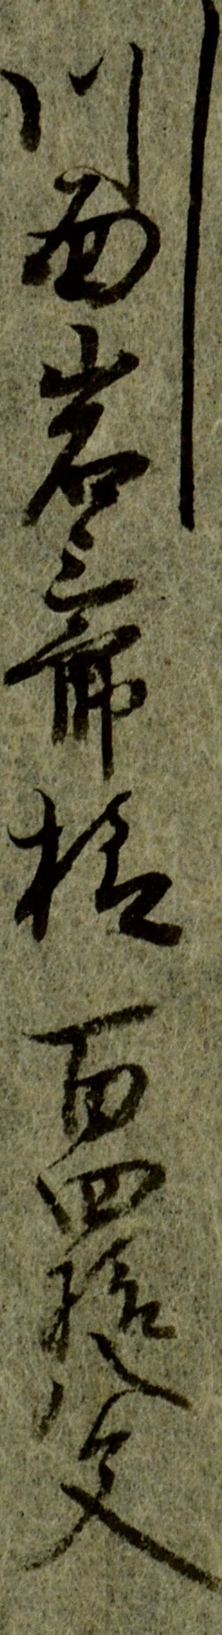川西岩三郎様百四拾八文
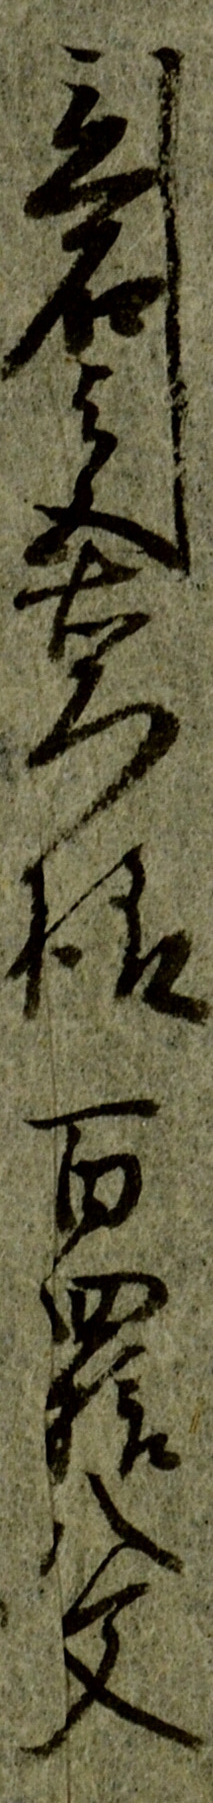立石与五右衛門様百四拾八文
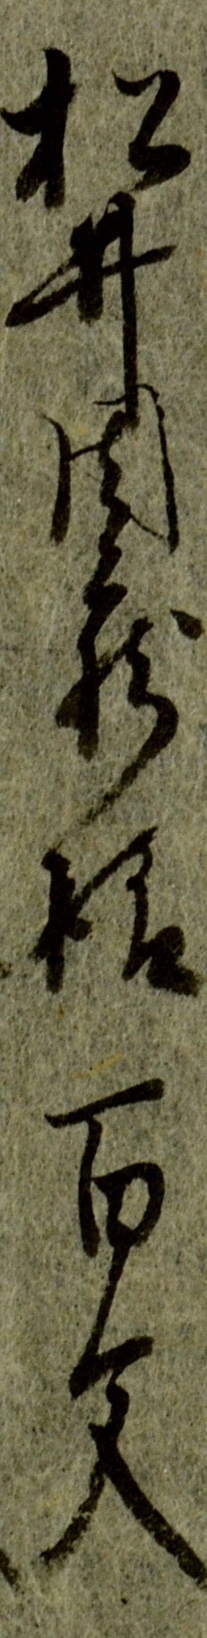松井周蔵様百文
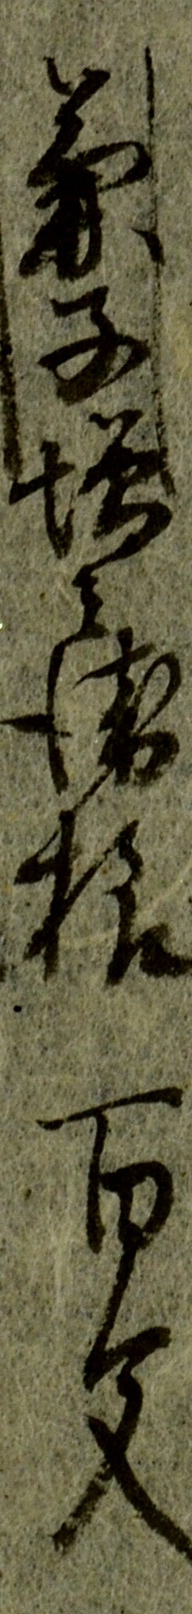兼子増兵衛様百文
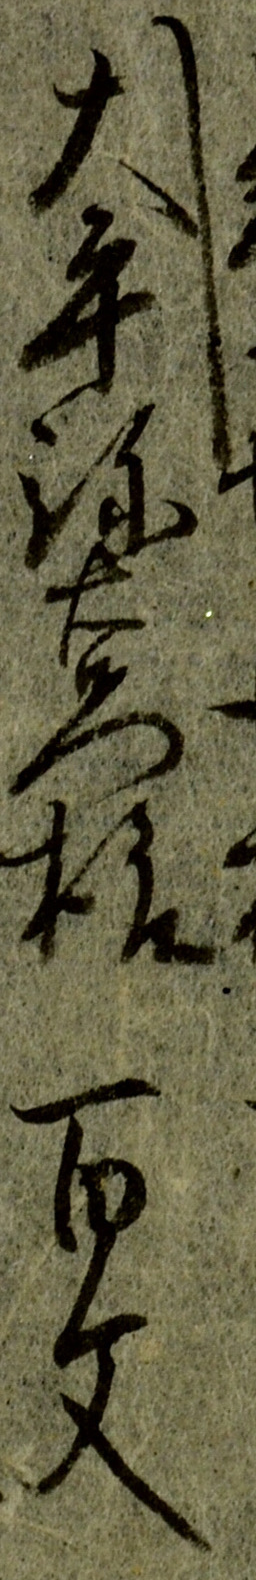大平弥右衛門様百文
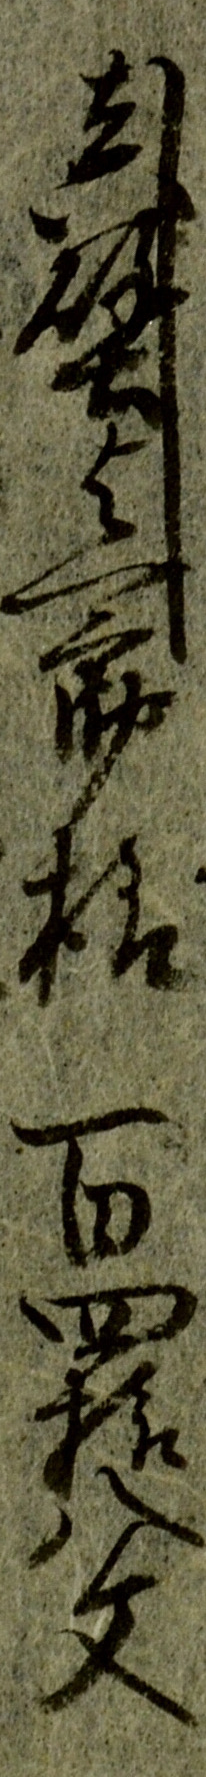真壁与一郎様百四拾八文
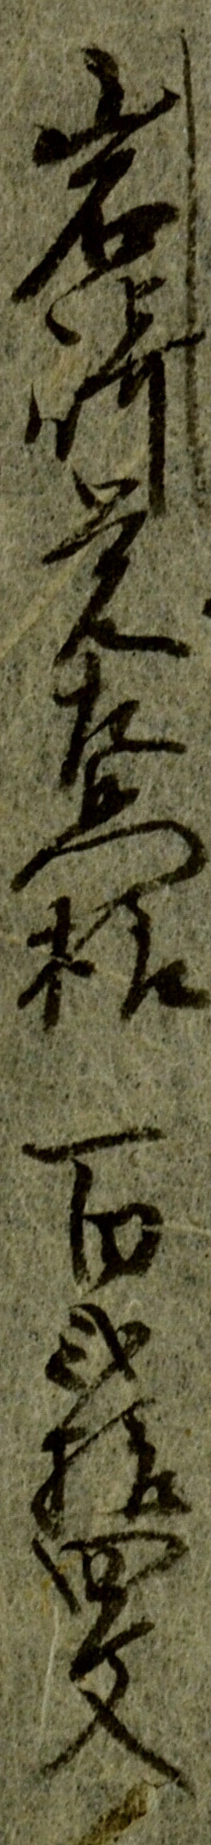岩崎覚左衛門様百弐拾四文
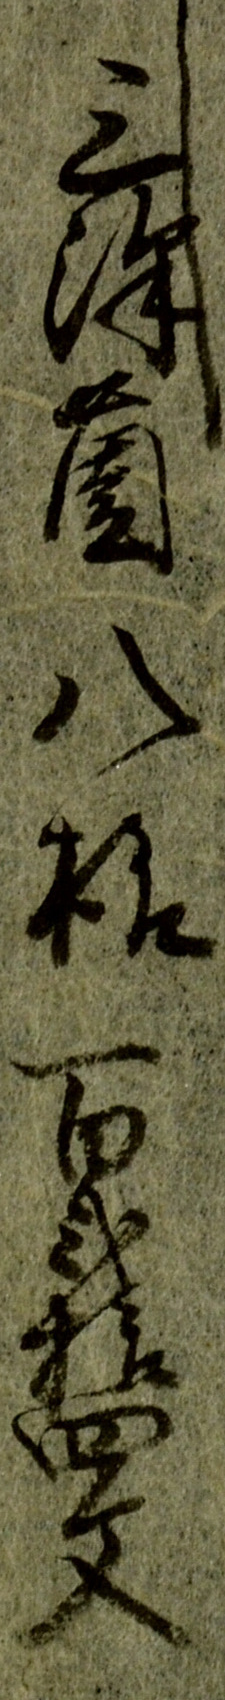三沢薗八様百弐拾四文

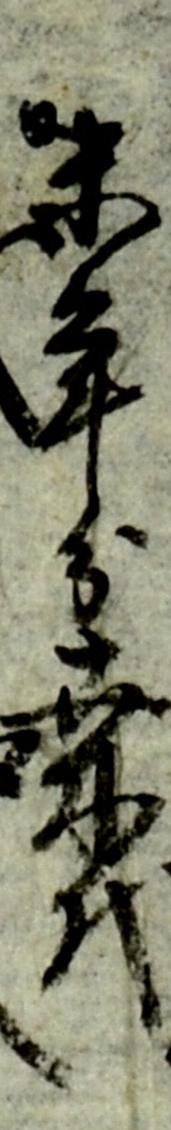未年分桑代
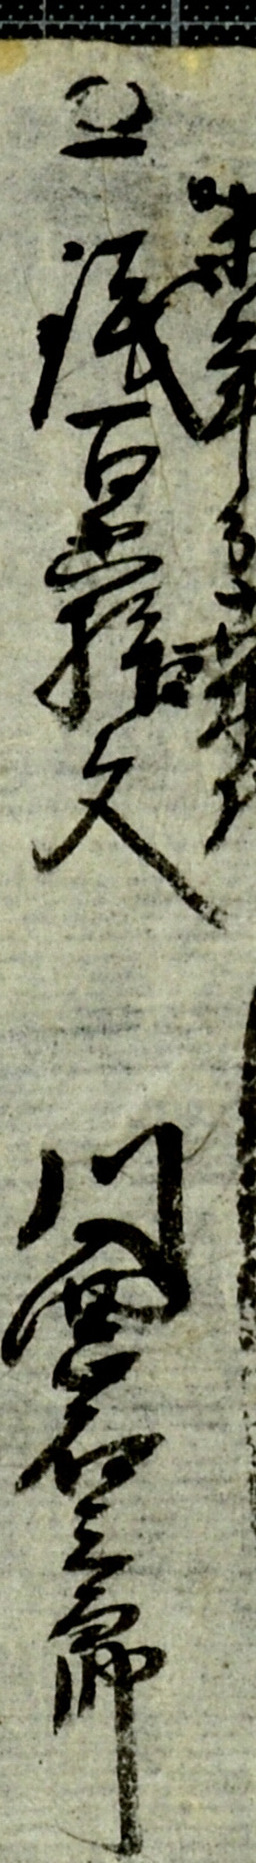○一銭百六拾文川西岩三郎
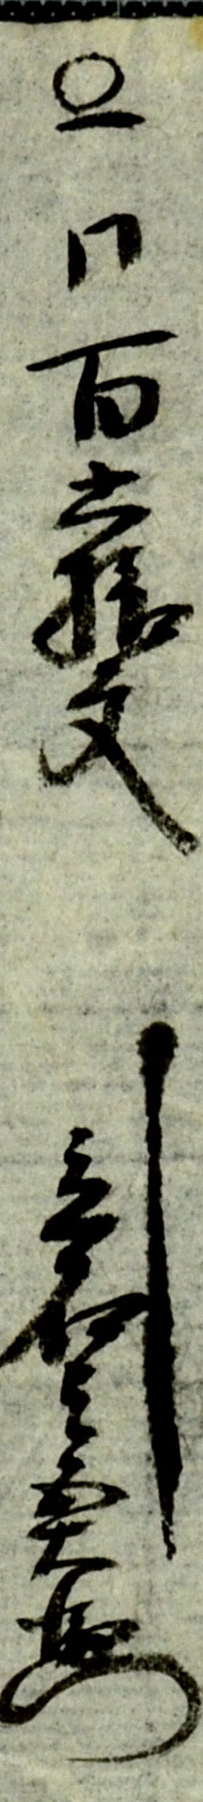○一同百六拾文立石与五右衛門
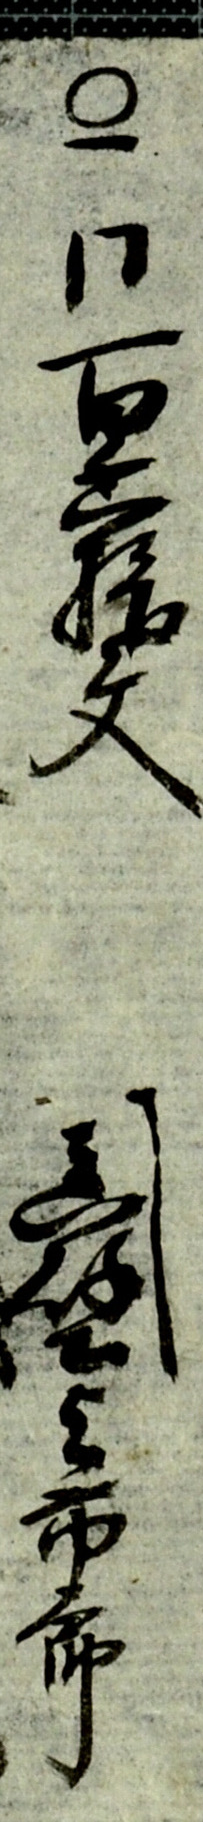○一同百六拾文真壁与市郎
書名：覚
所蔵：伊那市立高遠町図書館・合同会社AMANE
